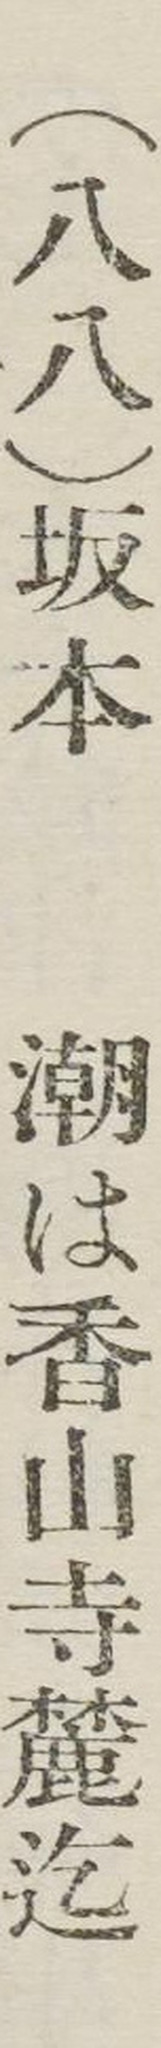坂本潮は香山寺麓迄
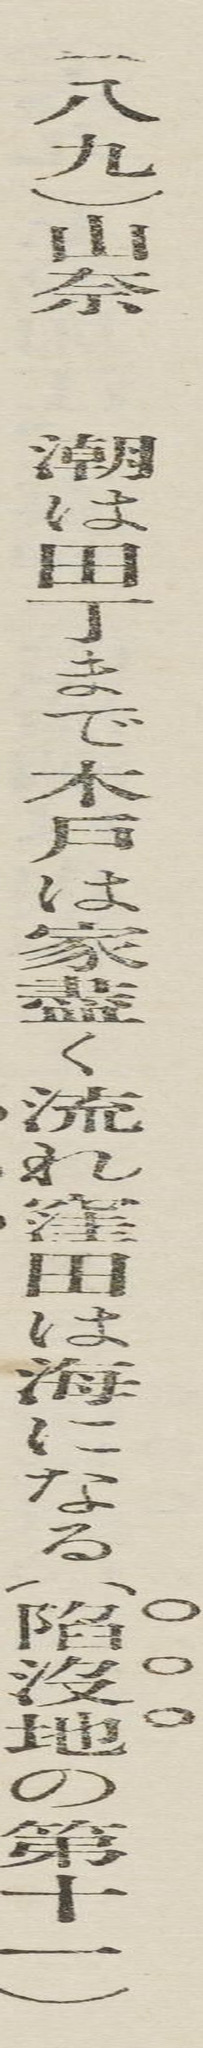山奈潮は田丁まで木戸は家尽く流れ窪田は海になるの第十一）
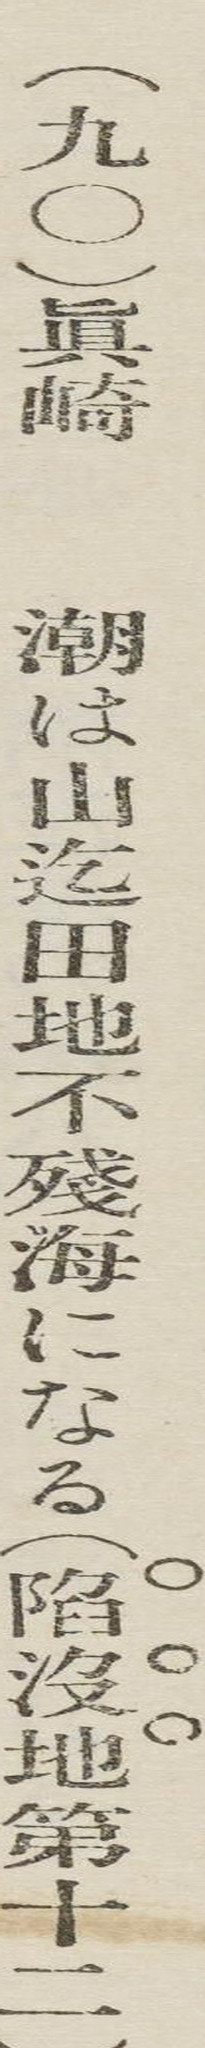真崎潮は山迄田地不残海になる第十二）
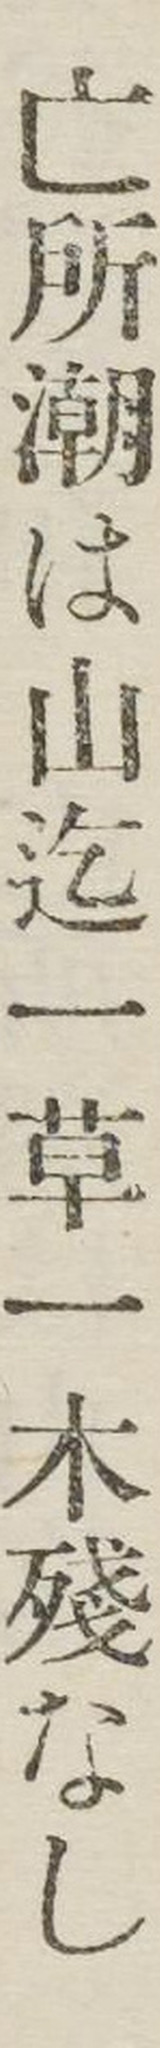初崎亡所潮は山迄一草一木残なし
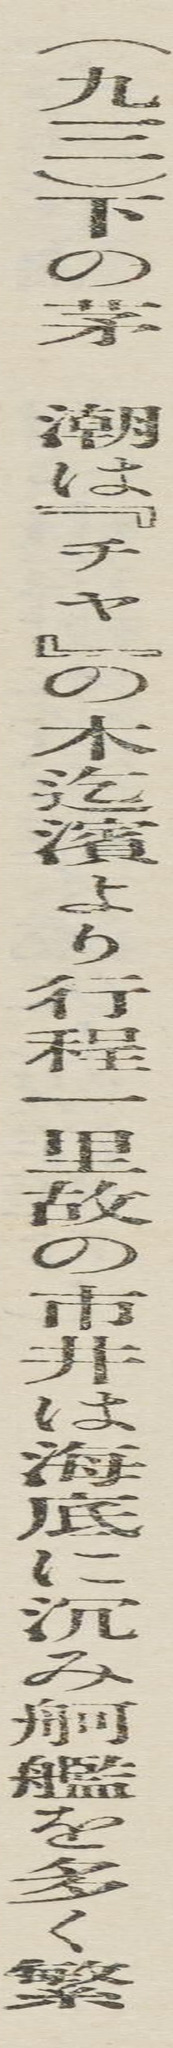下の茅潮は『チャ』の木迄浜より行程一里故の市井は海底に沉み舸艦を多く繁
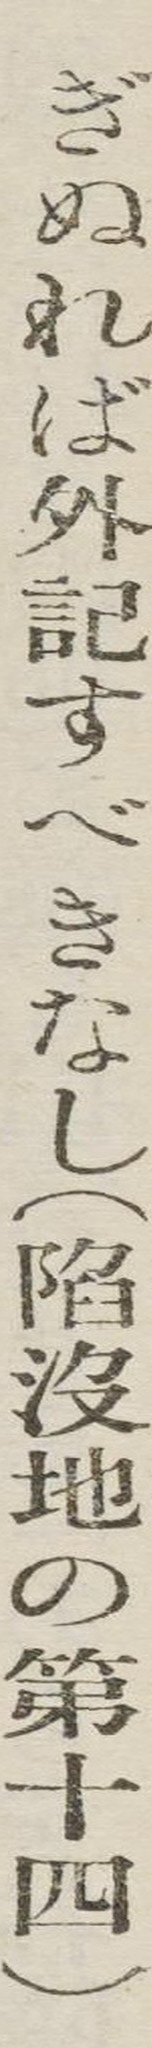ぎぬれば外記すべきなしの第十四）
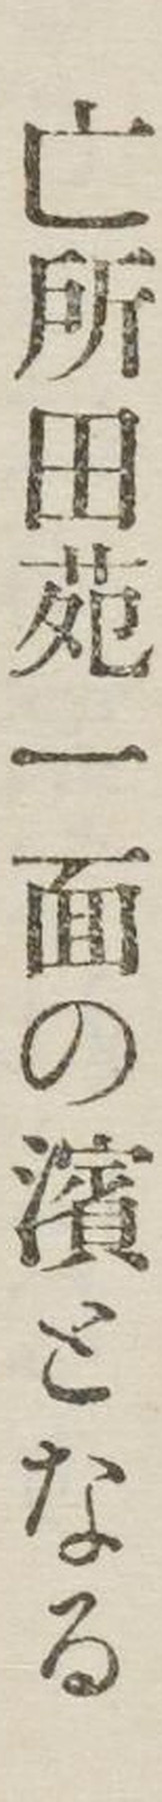亡所田苑一面の浜となる
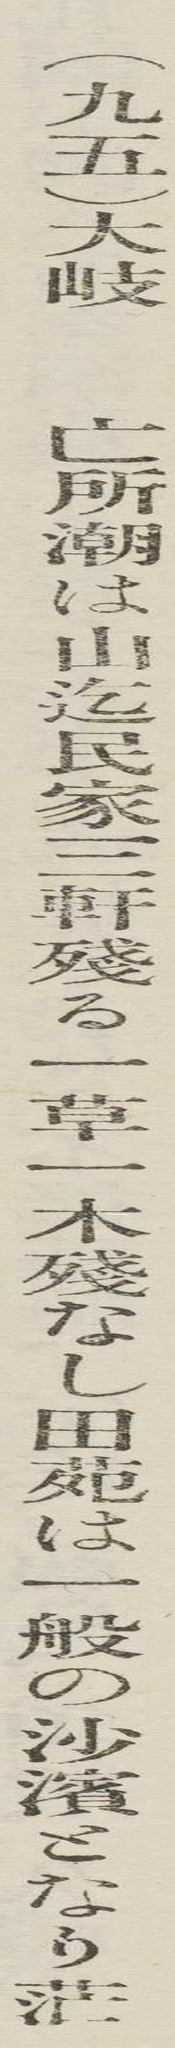大岐亡所潮は山迄民家三軒残る一草一木残なし田苑は一般の沙浜となり茫
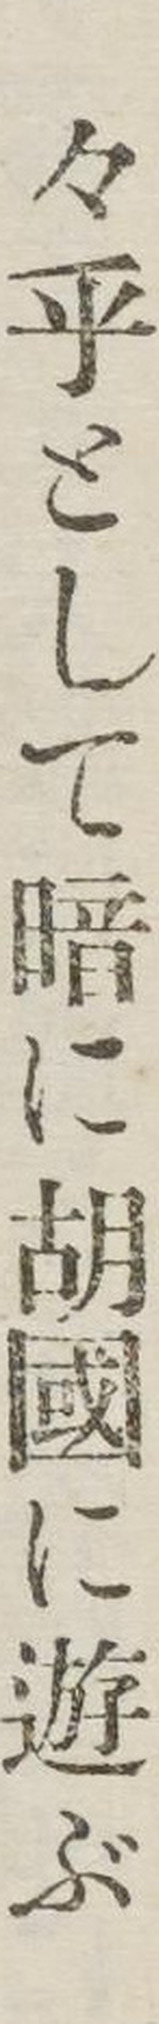々乎として暗に胡国に遊ぶ
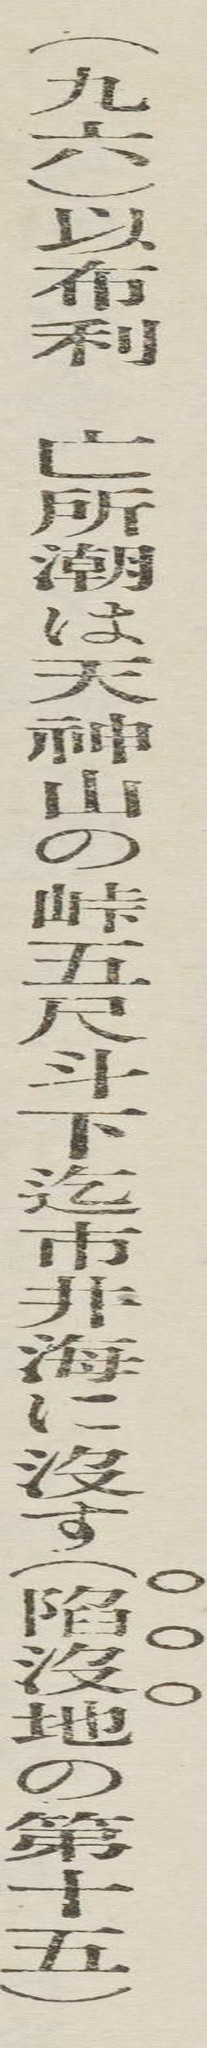以布利亡所潮は天神山の峠五尺斗下迄市井海に没すの第十五）
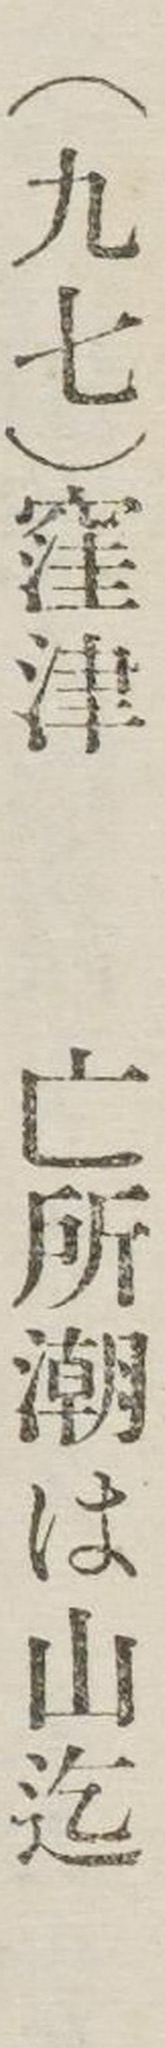窪津亡所潮は山迄
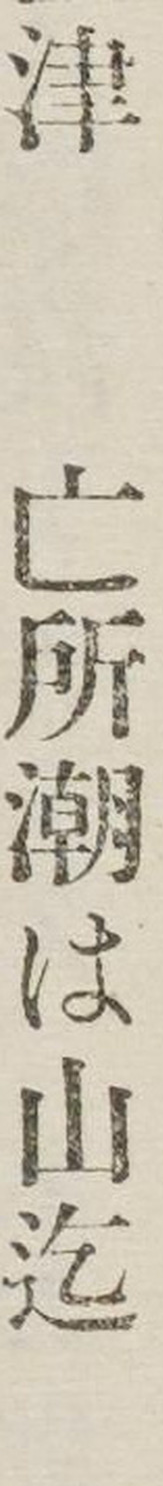窪津亡所潮は山迄
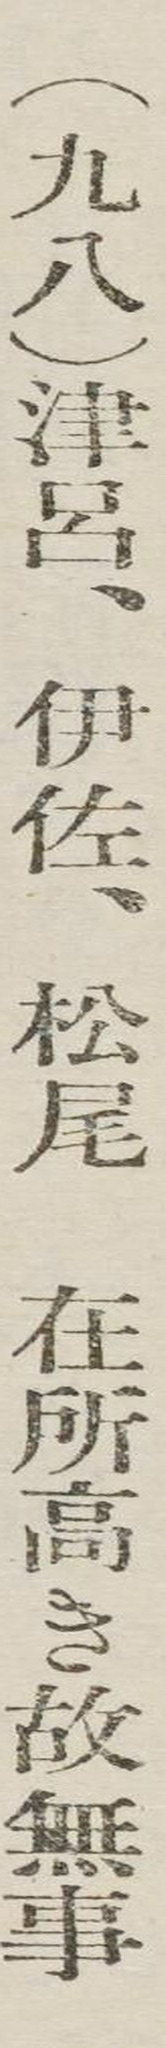津呂、伊佐、松尾在所高き故無事
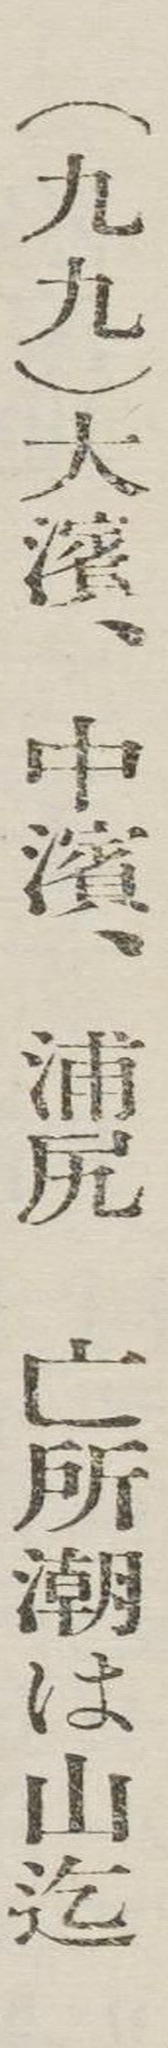大浜、中浜、浦尻亡所潮は山迄
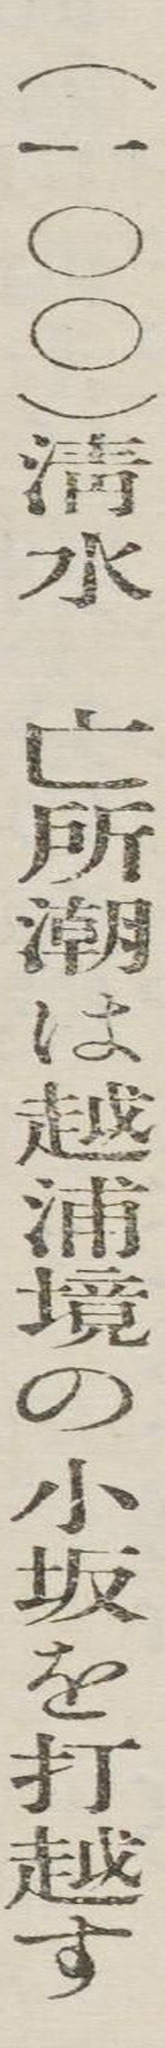清水亡所潮は越浦境の小坂を打越す
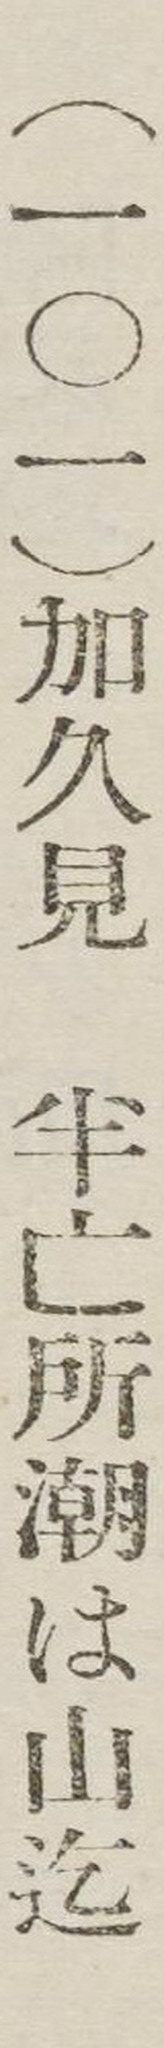加久見半亡所潮は山迄
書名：土佐古今ノ地震
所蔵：東京大学地震研究所図書室 Earthquake Research Institute Library, The University of Tokyo, JAPAN
